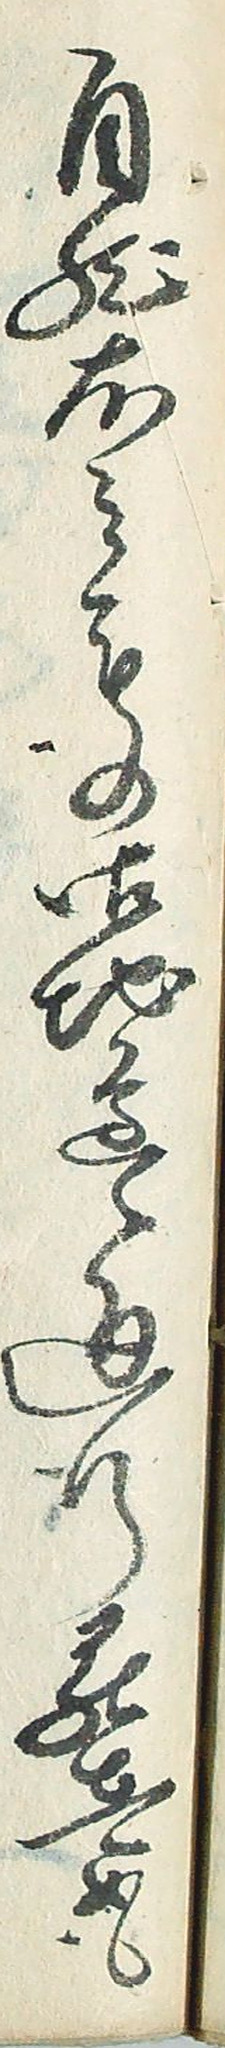自然右之もの御地邊へ通行罷在候義も
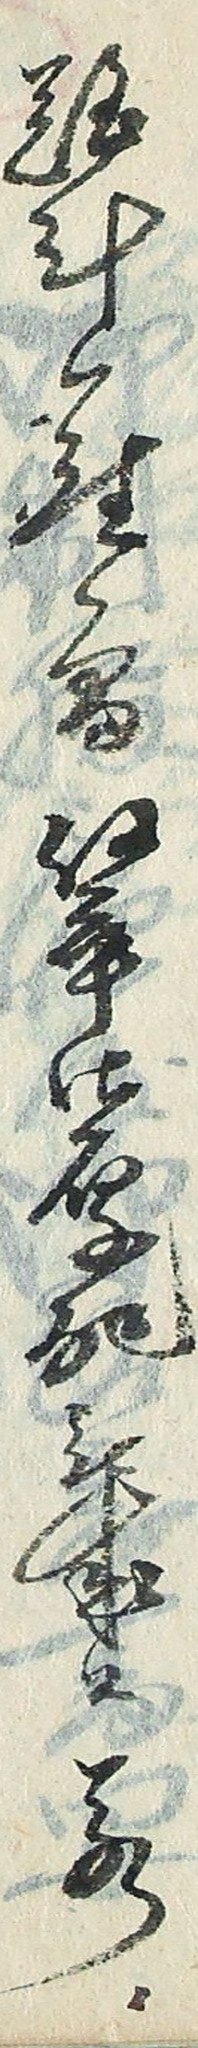難計御座候間何卒御厚配被成候若
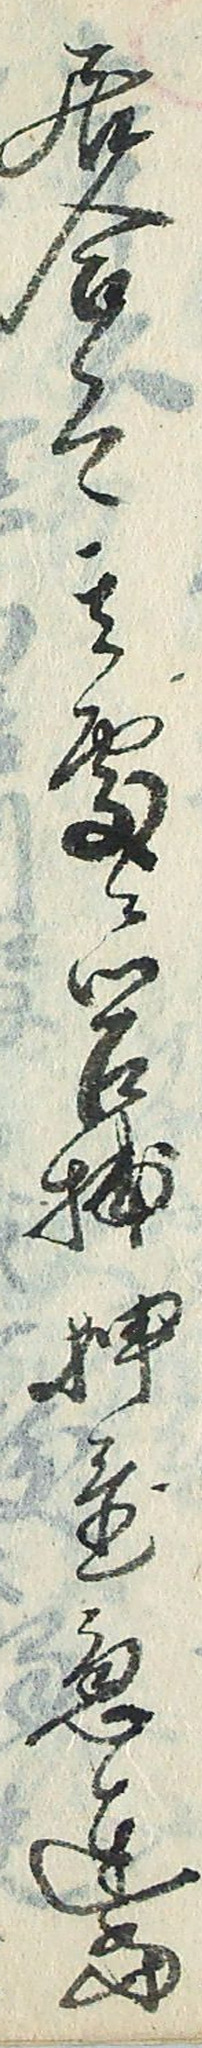居合候ハヽ其處ニ御召捕押置急達當
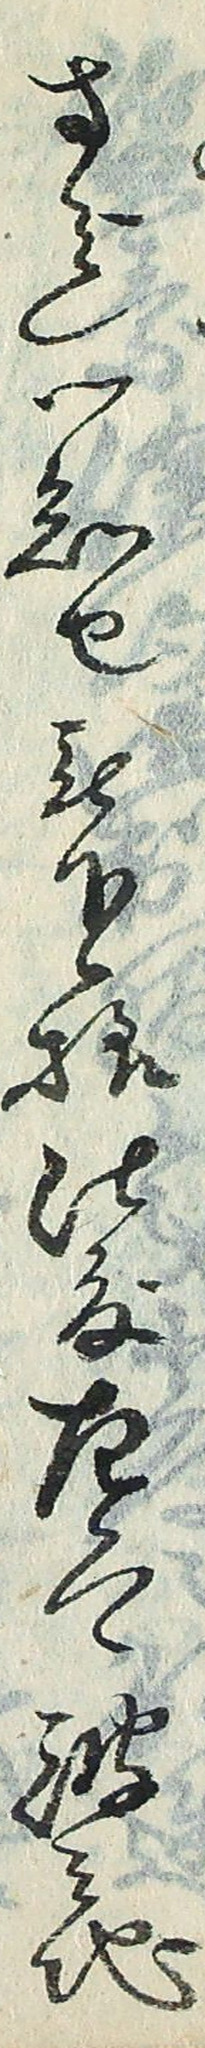方迄御知セ被下候様此度左候候ハヽ彼之地
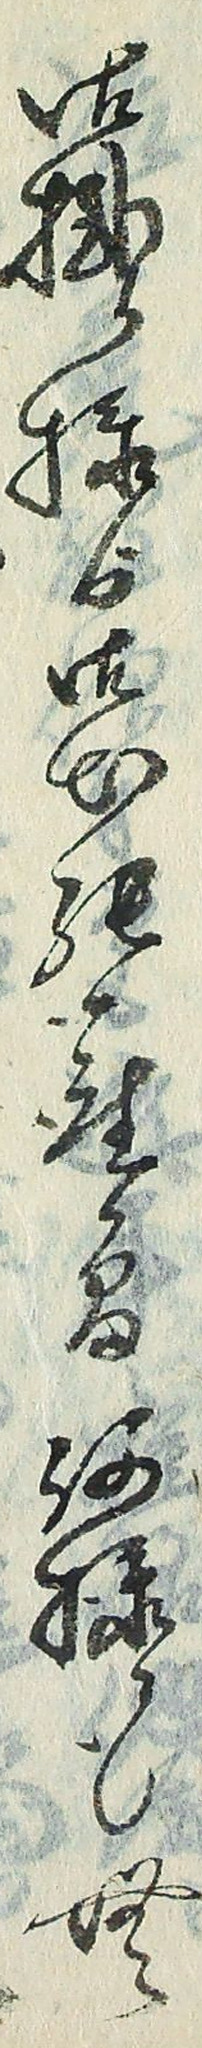御掛り様ゟ御出張御座候間何様ニも無
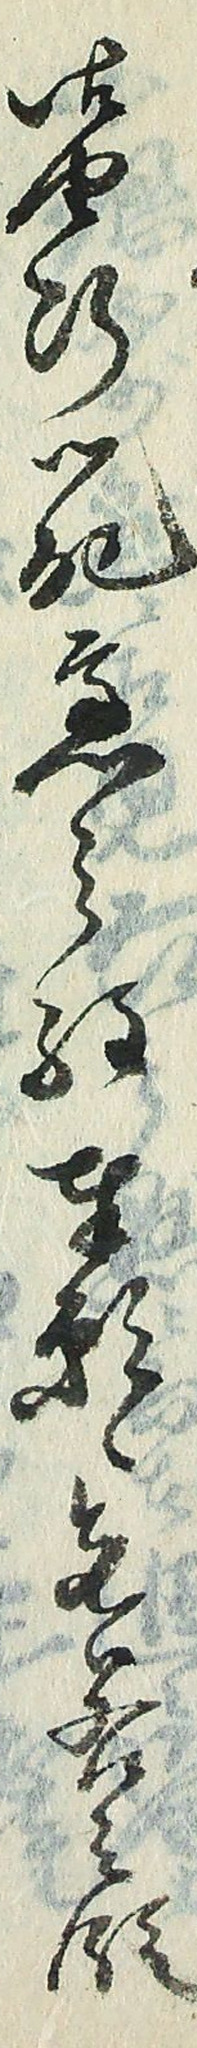御油断御配慮之程奉願候先ハ右之段
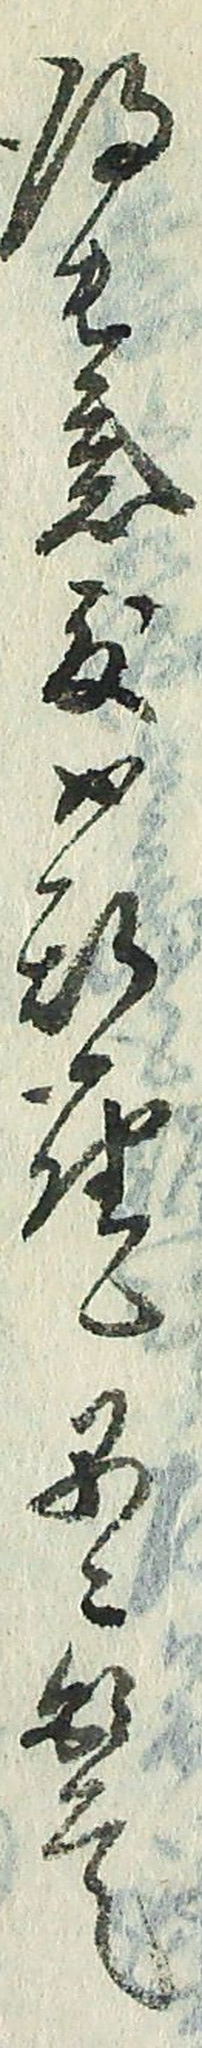得貴意度如斯御座候早々頓首
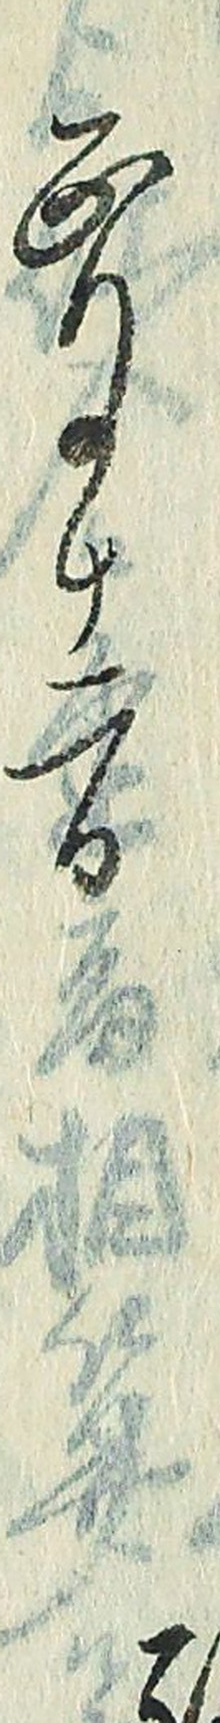正月十二日
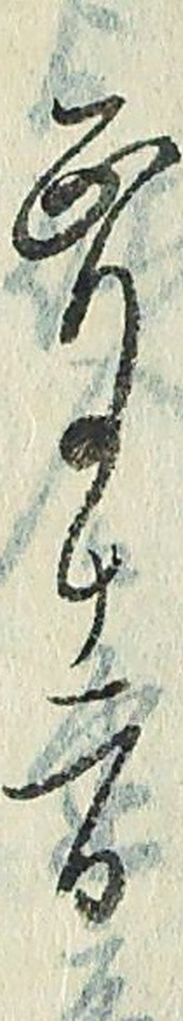正月十二日
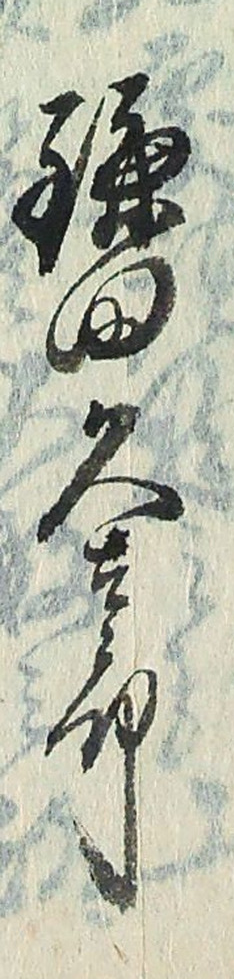鎌田久太郎
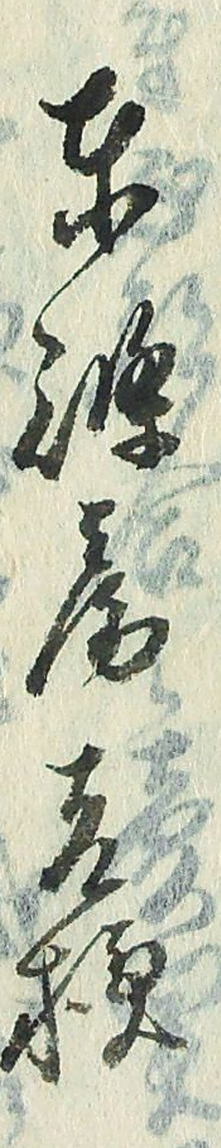東條房吉様
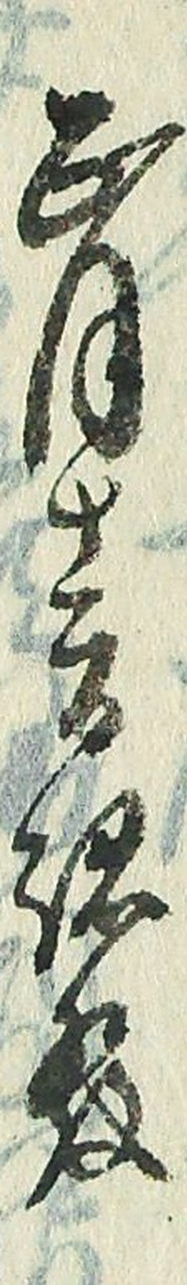正月十二日認發
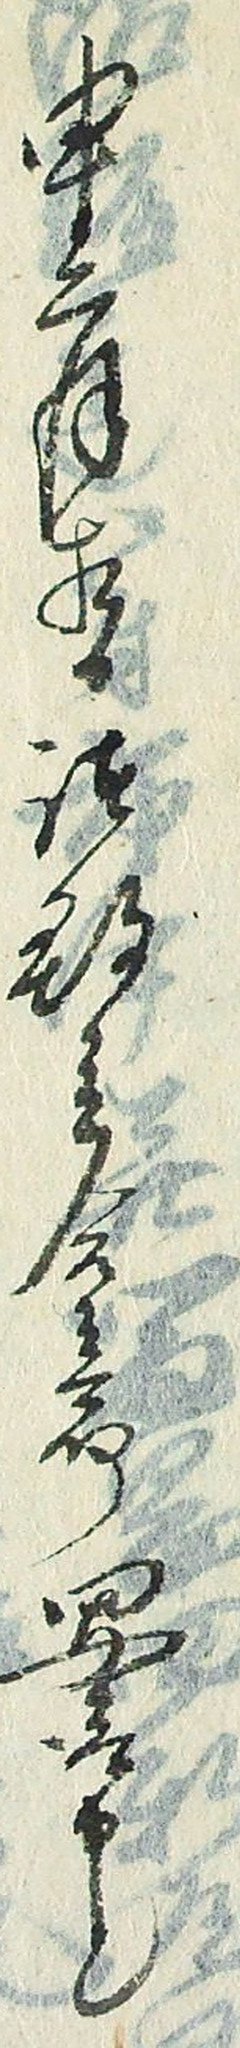申二月十九日諸郡立合之節写取申候

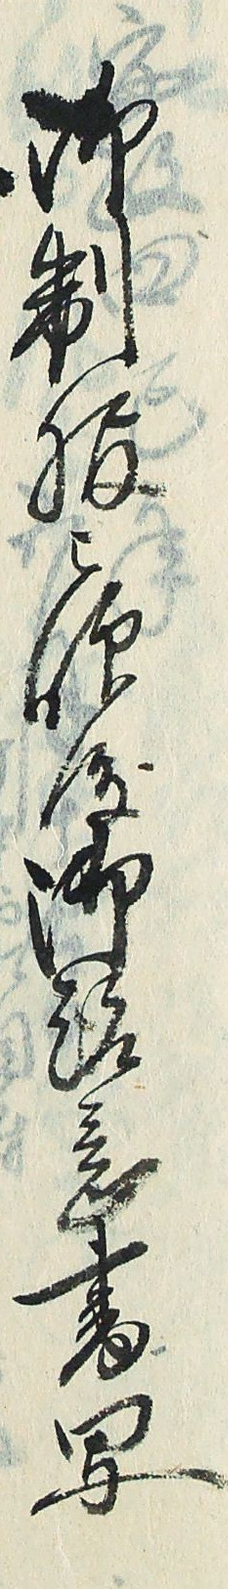御制服被仰渡御趣意書写
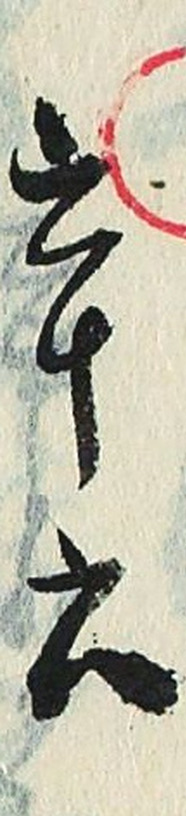六十六
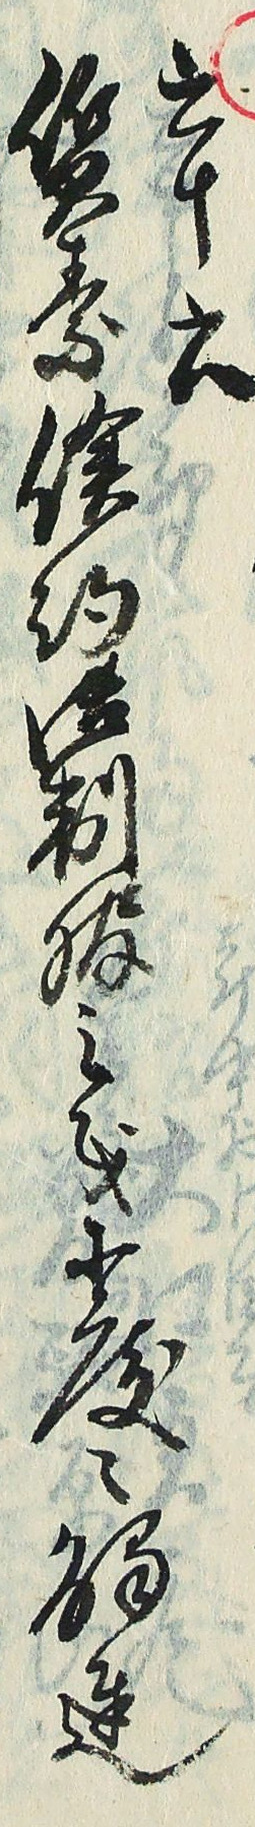質素倹約御制服之義尓度々觸達
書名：諸御趣意書并御下知向之写
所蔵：鳴門教育大学 Naruto University of Education
